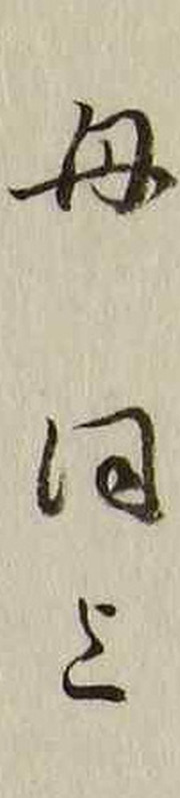母同上
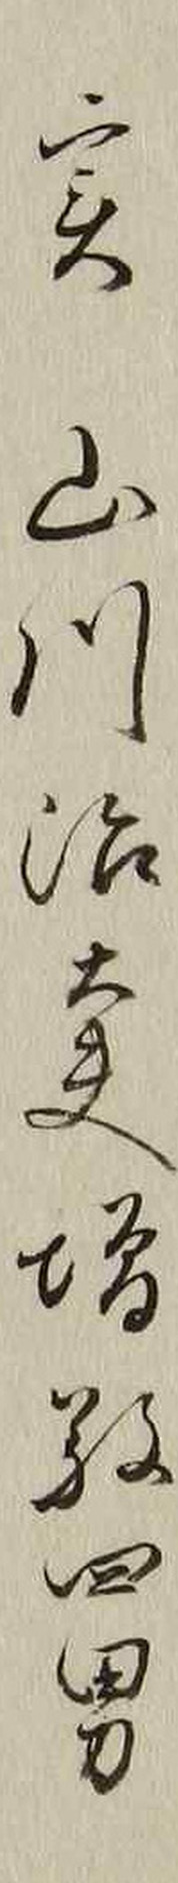実山川治大夫増敬四男
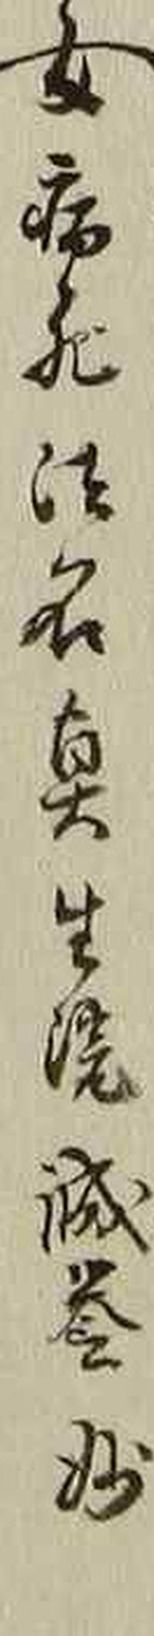病死法名真生院誠誉妙
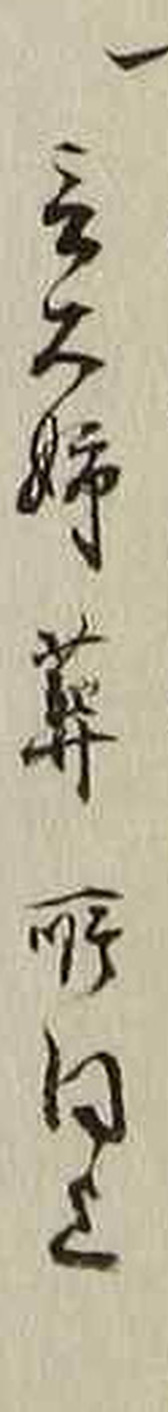言大姉葬所同上
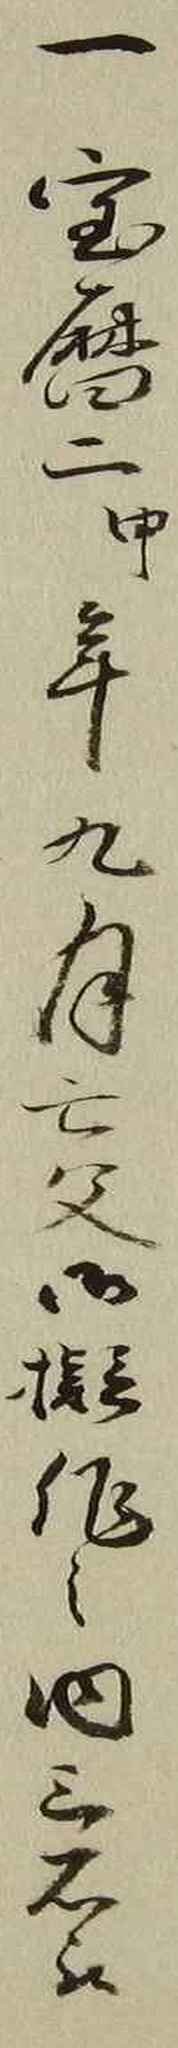一宝暦二申年九月亡父御擬作之内三石被
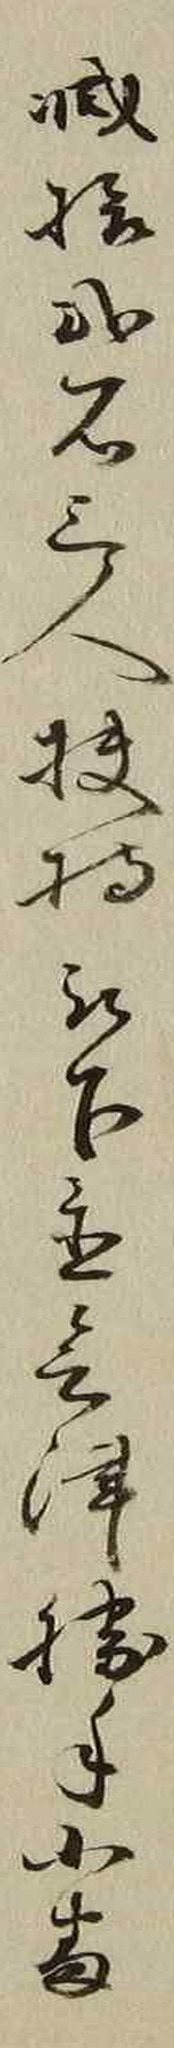減拾弐石三人扶持被下置会津勝手小番
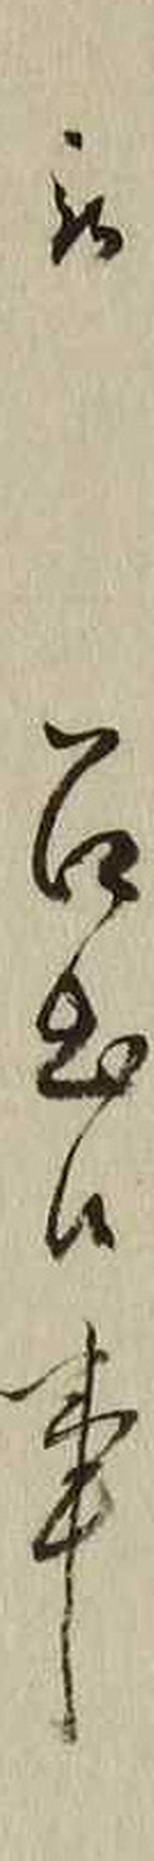被召出候事
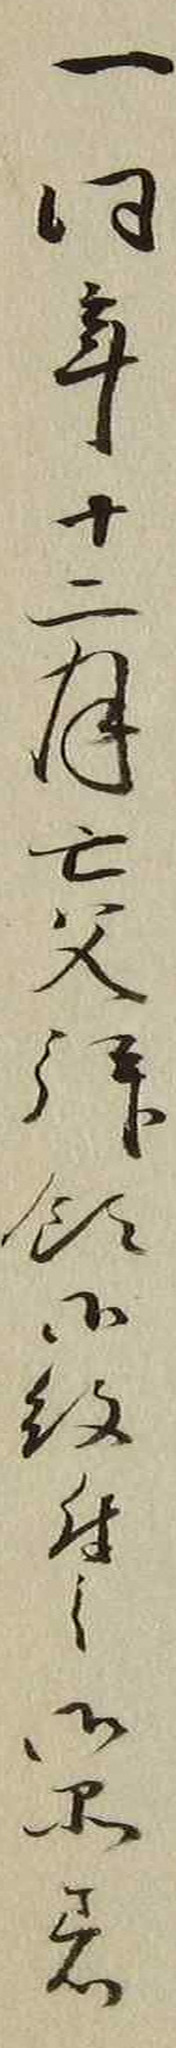一同年十二月亡父拝領御紋付之御品着
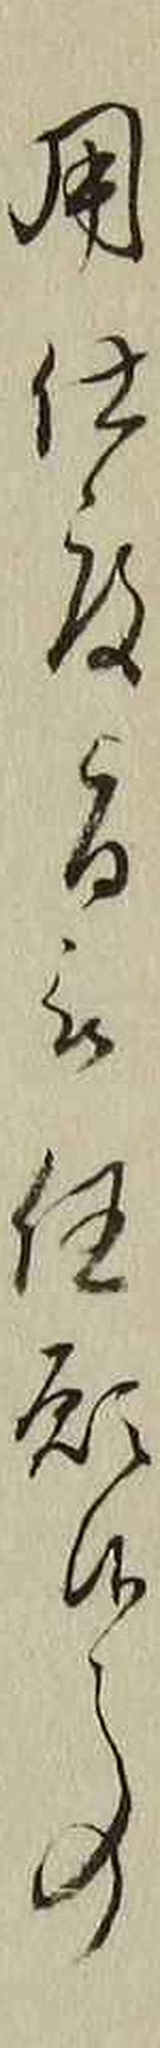用仕度旨被任願候事
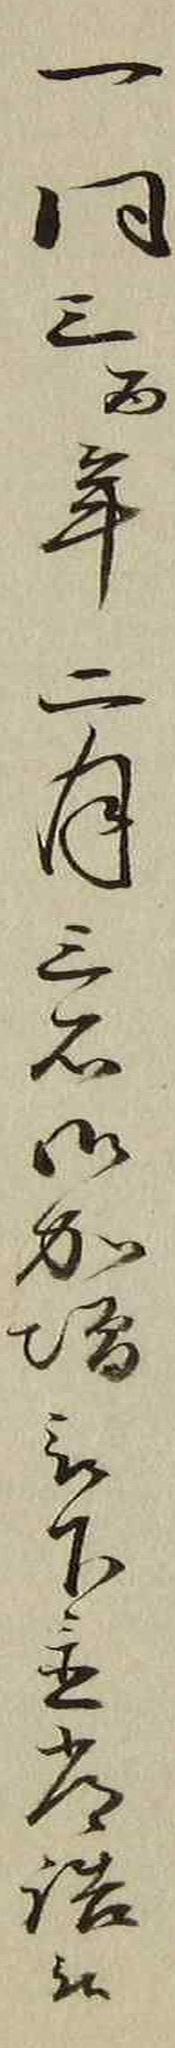一同三酉年二月三石御加増被下置常詰被
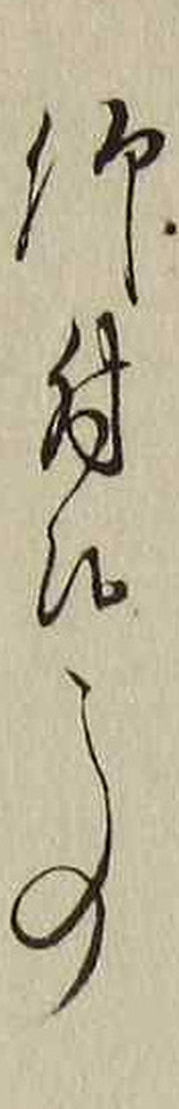仰付候事
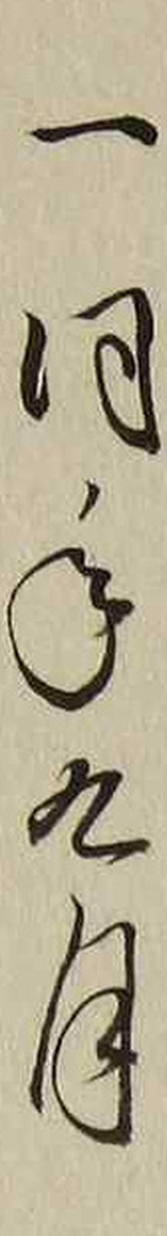一同年九月
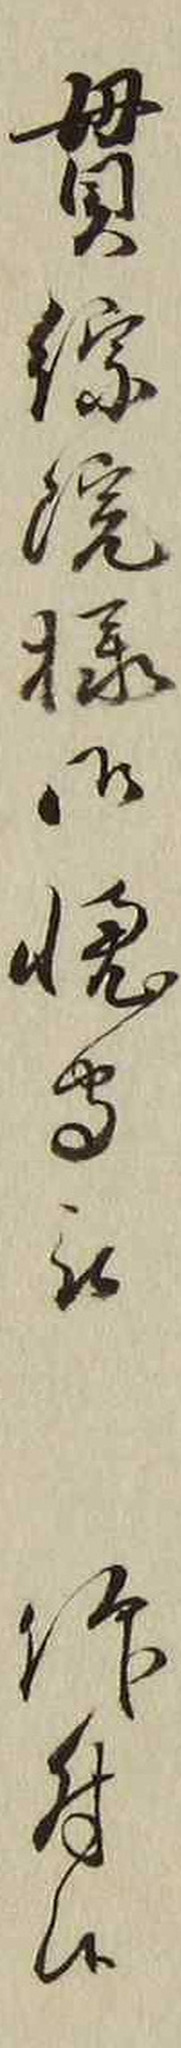貫綜院様御懐守被仰付候
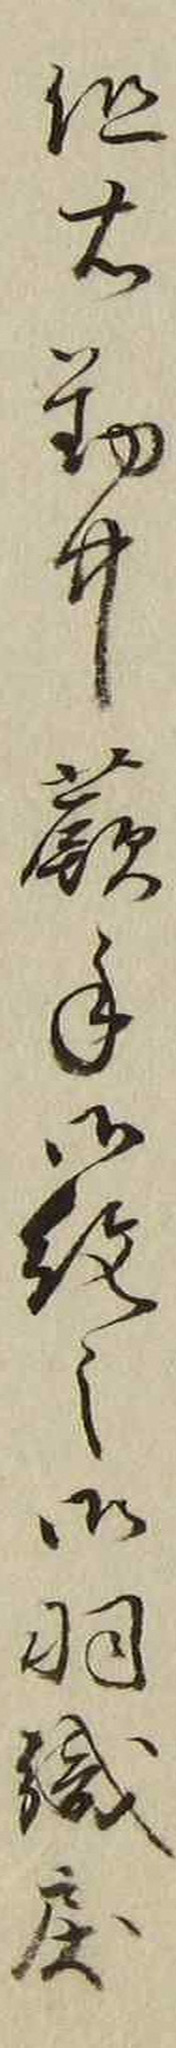但右勤中蕨手御紋之御羽織戻

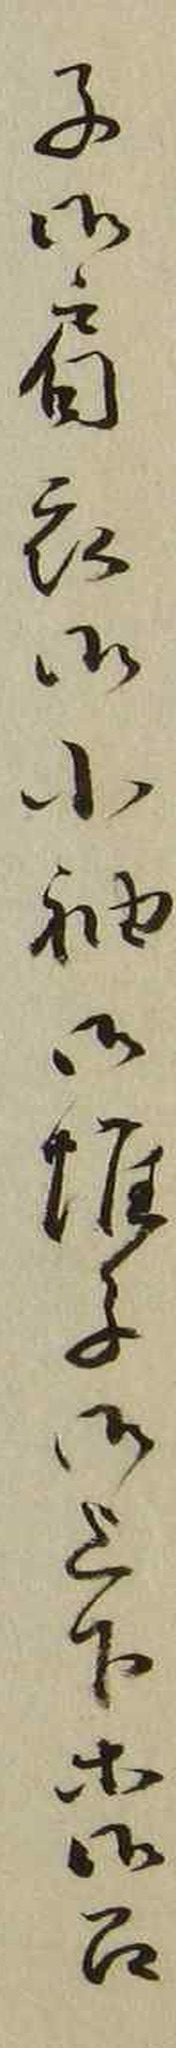子御肩衣御小袖御帷子御上下等御召
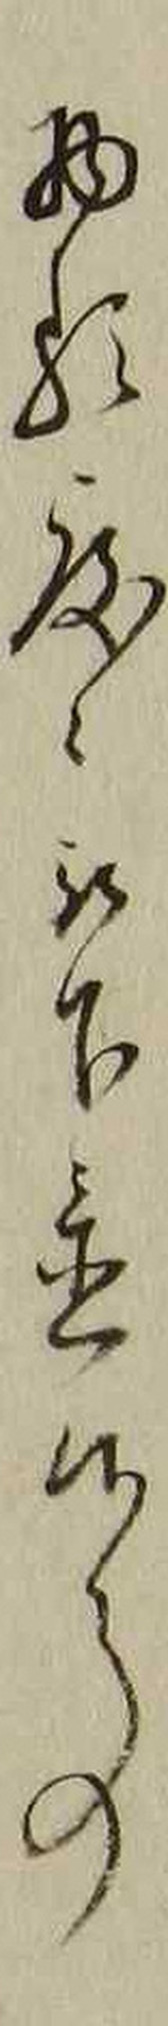拝領度々被下置候事
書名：諸士系譜　巻之4　い之部4
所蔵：会津若松市立会津図書館
